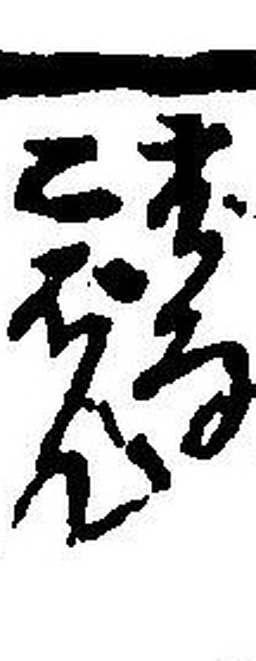こばん
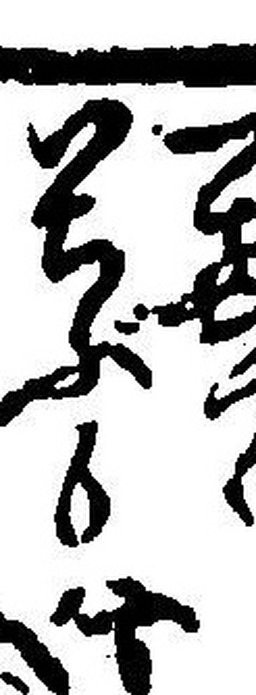いちぶも
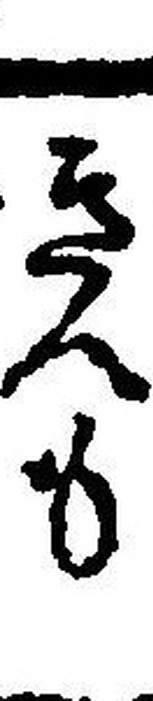きんも
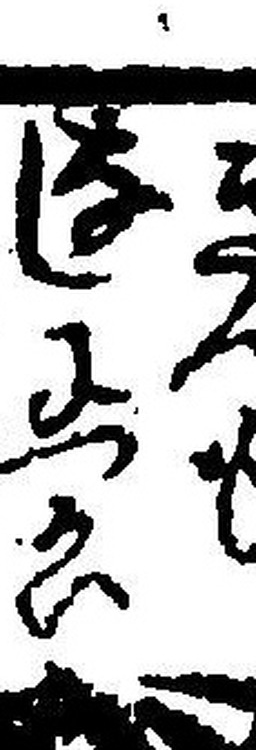なしにつかい
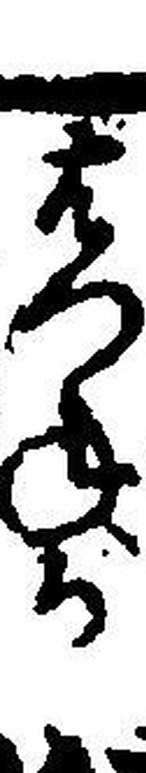はつねが
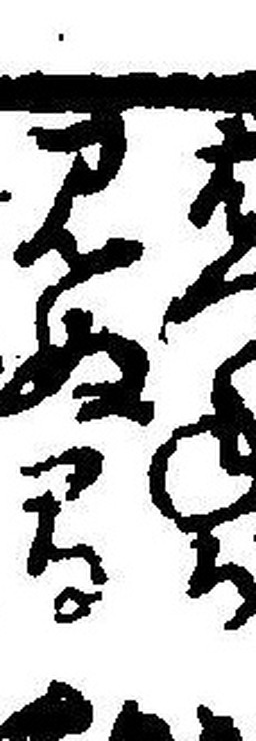見ぬ間
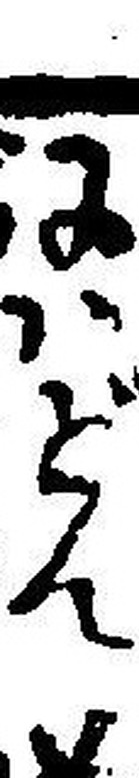にはどん
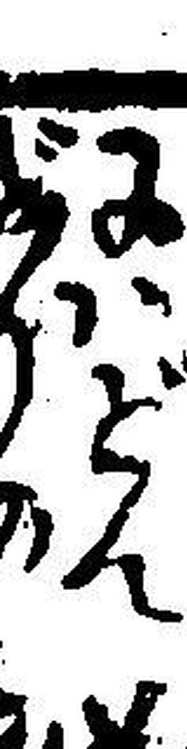ぶりの
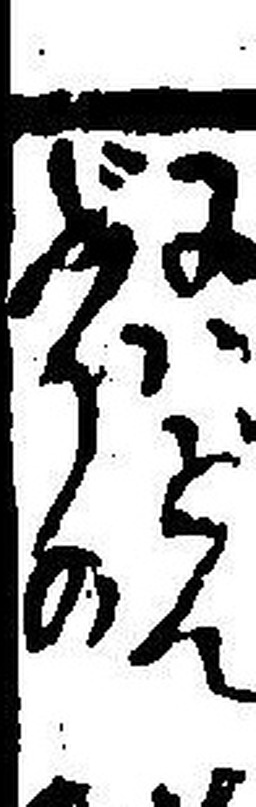ぶりの
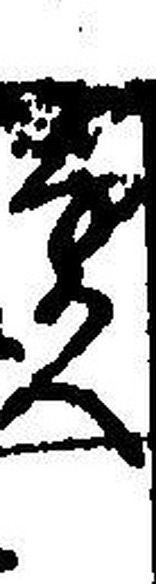なかへ
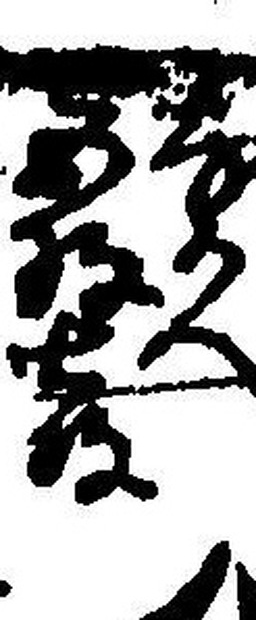五枚七枚
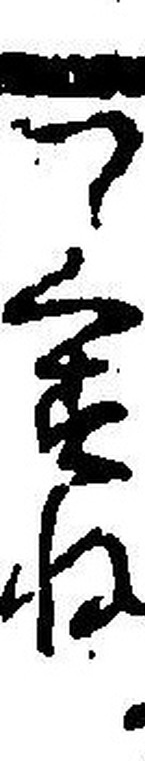つゝくすね
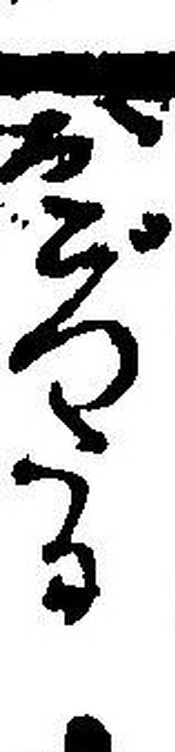おごつたり
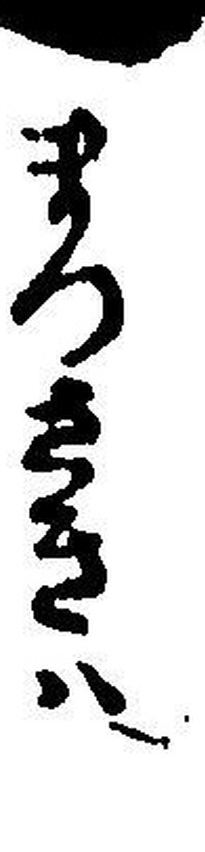まつさきは
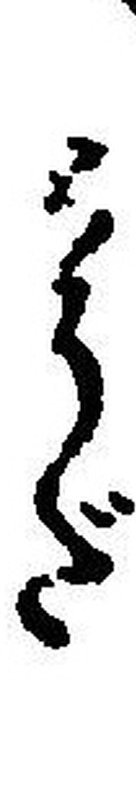とうだ
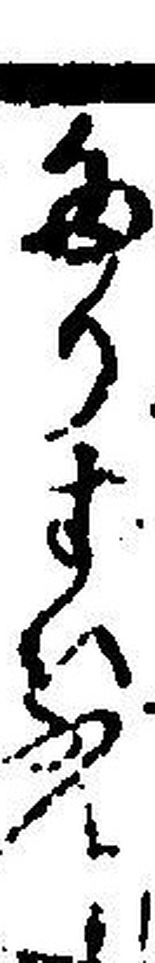たりすいふん
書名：間違狐之女郎買 / 市場通笑作
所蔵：東京大学総合図書館 General Library in the University of Tokyo, JAPAN
